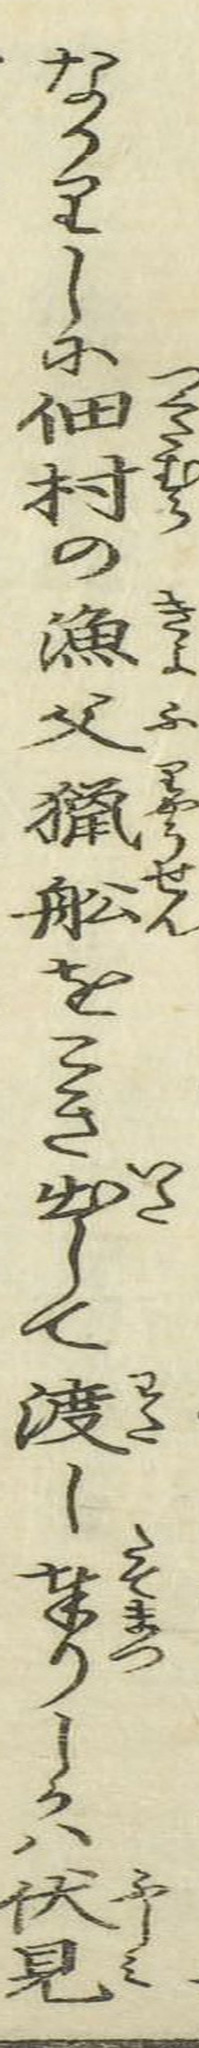なかりしに佃村の漁夫猟舩をこき出して渡し奉りしかは伏見
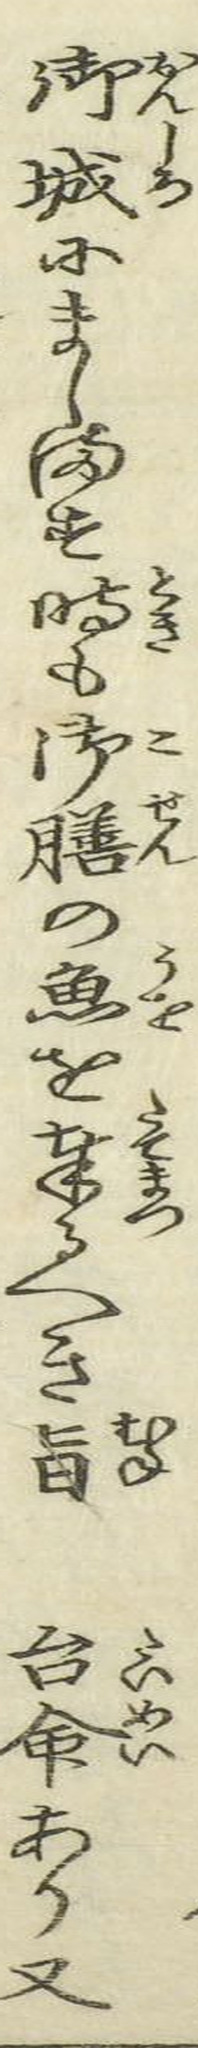御城にまします時も御膳の魚を奉るへき旨台命あり又
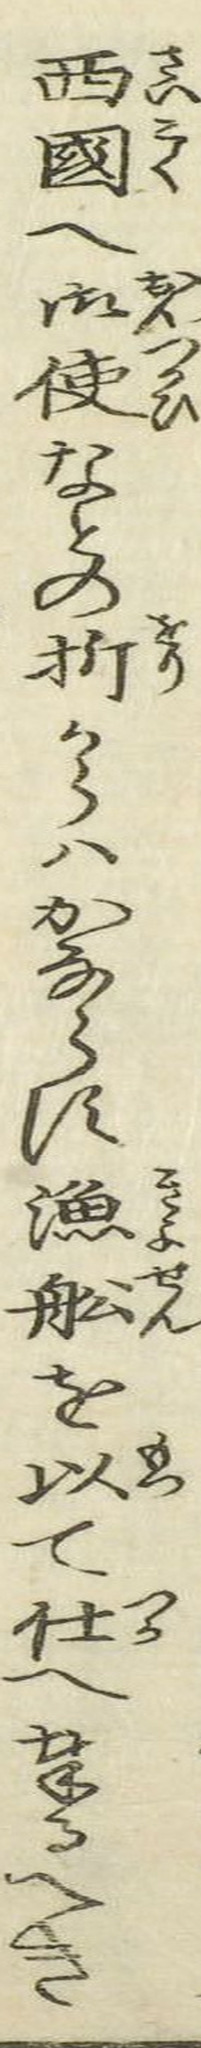西国へ御使なとの折からはかならす漁船を以て仕へ奉るへき
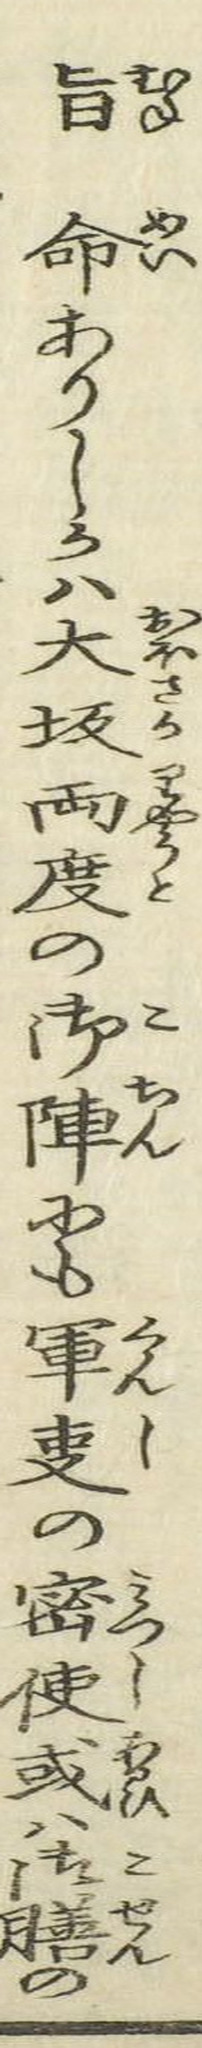旨命ありしかは大坂両度の御陣にも軍事の密使或は御膳の
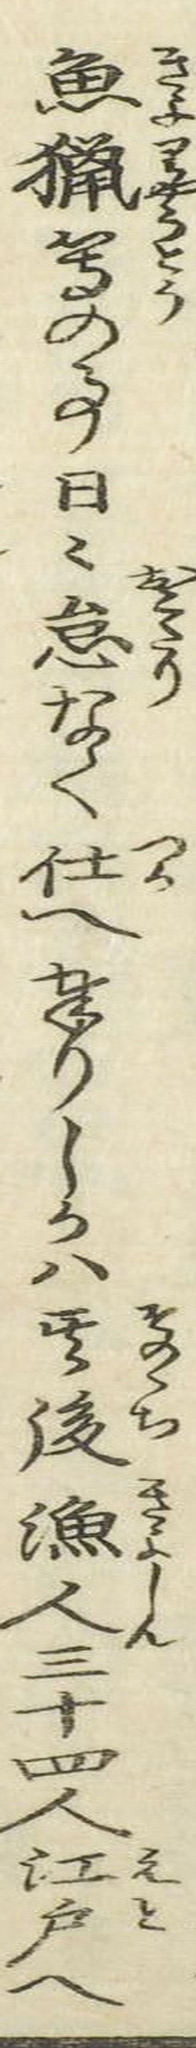魚猟等の事日々怠なく仕へ奉りしかは其後漁人三十四人江戸へ
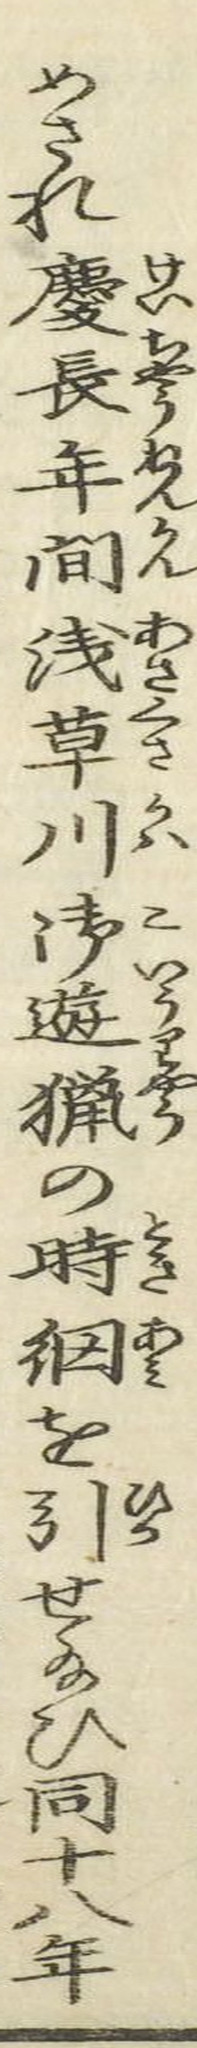めされ慶長年間浅草川御遊猟の時網を引せ給ひ同十八年
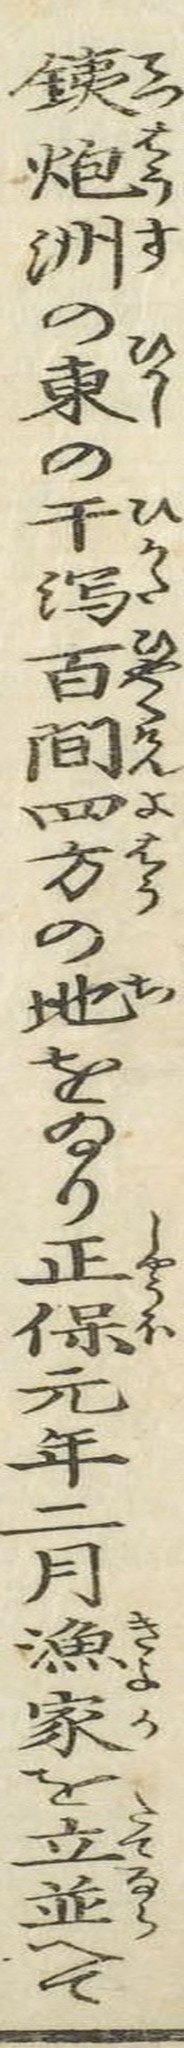鉄炮洲の東の干潟百間四方の地を給り正保元年二月漁家を立並へて
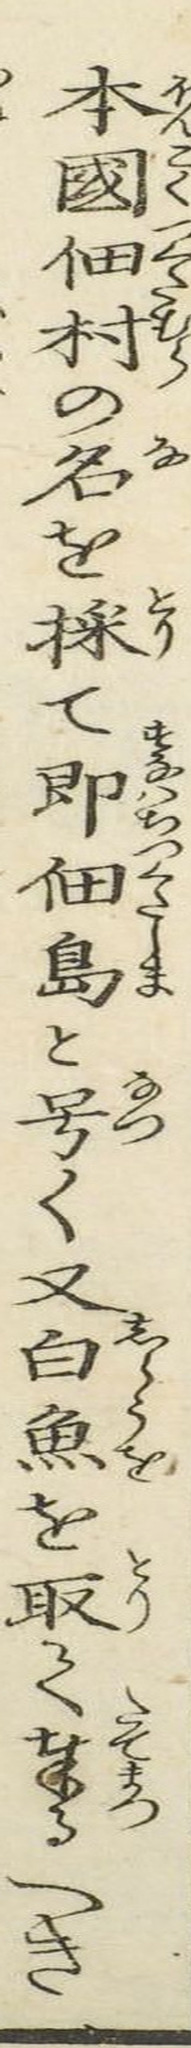本國佃村の名を採て即佃島と号く又白魚を取て奉るへき
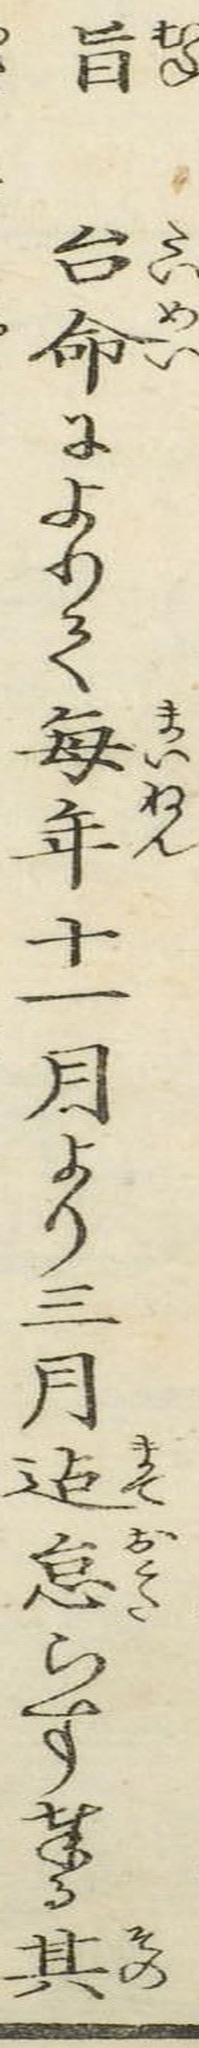旨台命によりて毎年十一月より三月迄怠らす奉る其
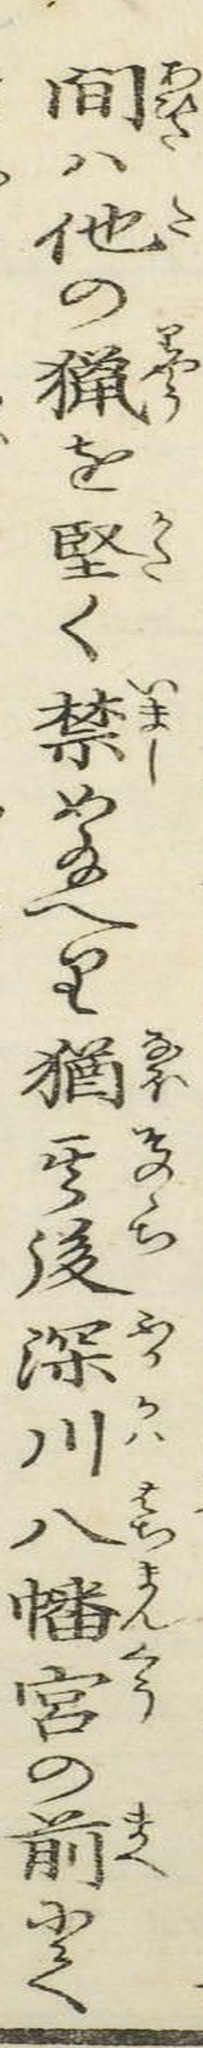間は他の猟を堅く禁め給へり猶其後深川八幡宮の前にて
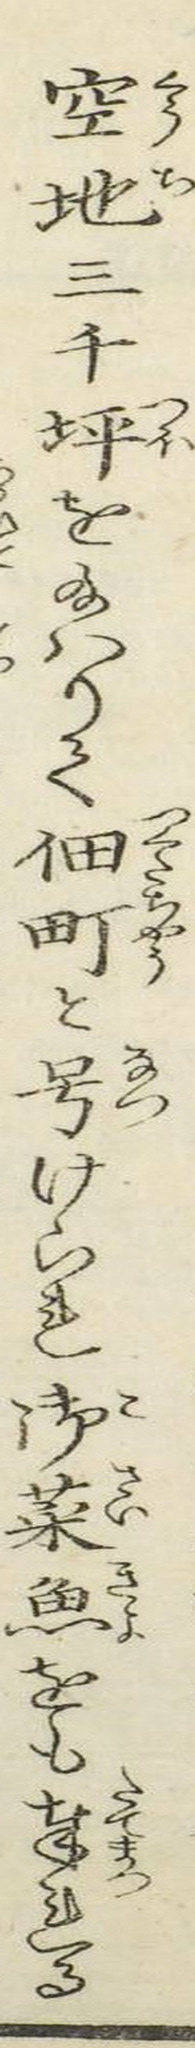空地三千坪を給はりて佃町と号けられ御菜魚をも奉れる
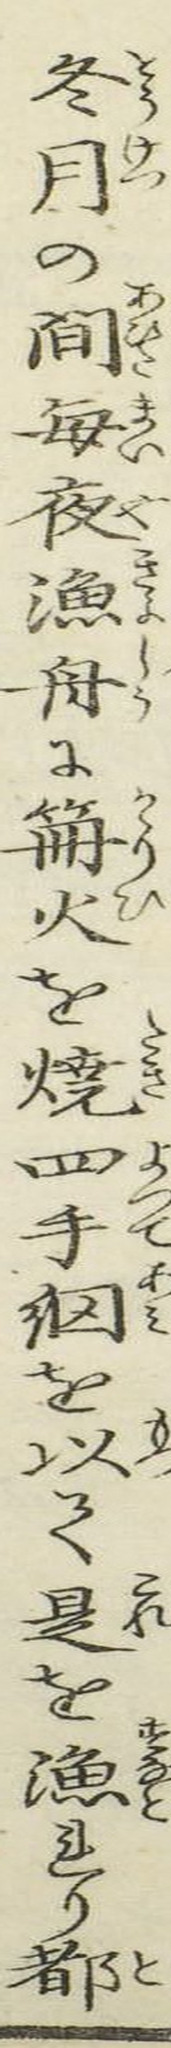冬月の間毎夜漁舟に篝火を焼四手網を以て是を漁れり都
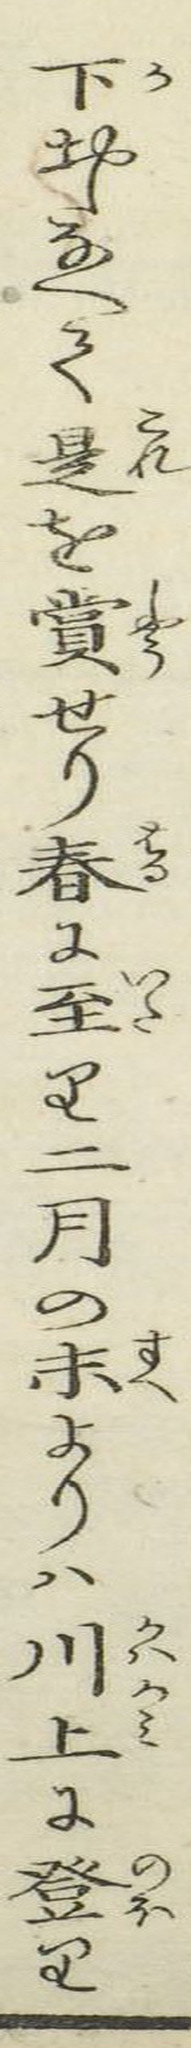下おしなへて是を賞せり春に至り二月の末よりは川上に登り
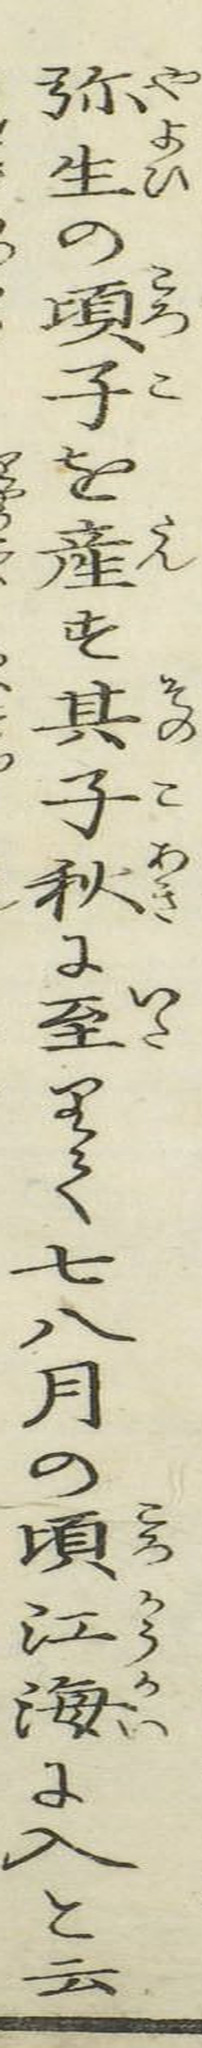弥生の頃子を産す其子秋に至りて七八月の頃江海に入と云
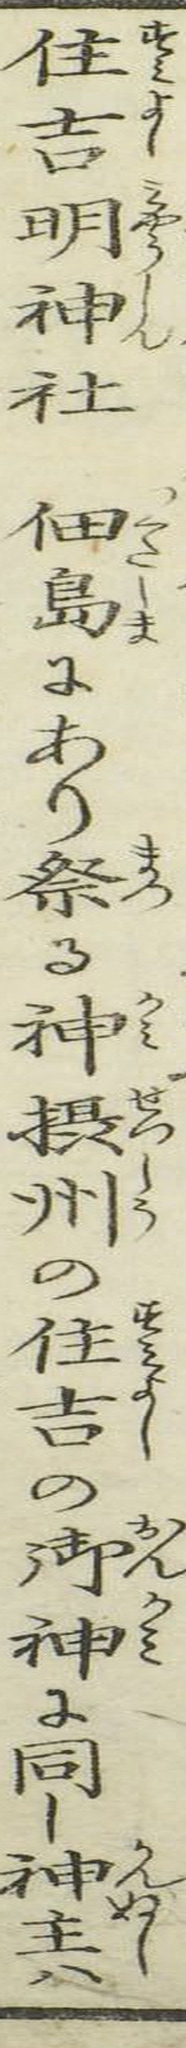住吉明神社佃島にあり祭る神摂州の住吉の御神に同し神主は
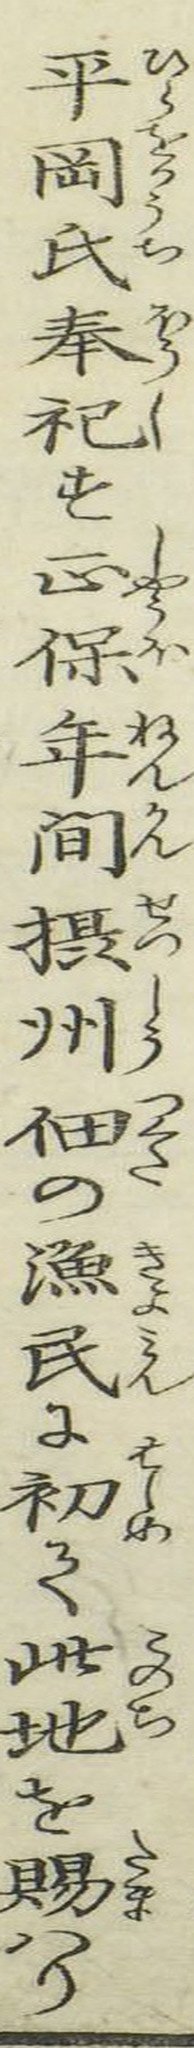平岡氏奉祀す正保年間摂州佃の漁民に初て此地を賜はり
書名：江戸名所図会 20巻 巻之2
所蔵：東京学芸大学教育コンテンツアーカイブ
